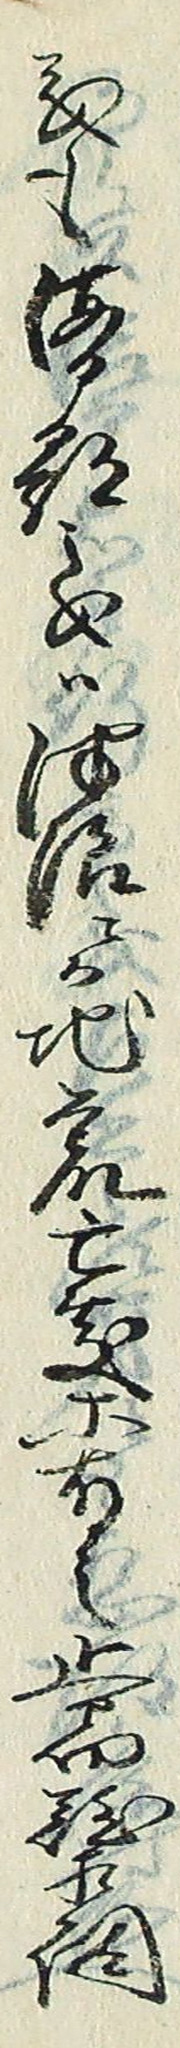義も海部郡之義ハ津浪ニ而地荒亡處等有之止宿難相調
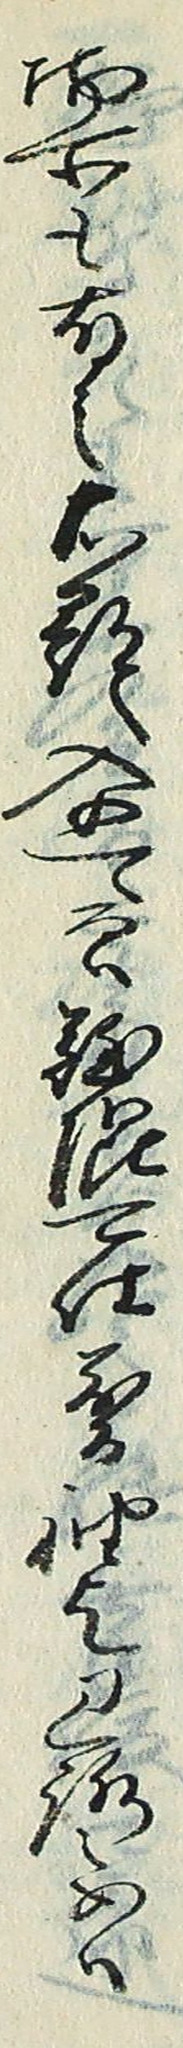場所も有之右郡へ入込候而ハ難渋可仕別而袖乞辺路之義ハ
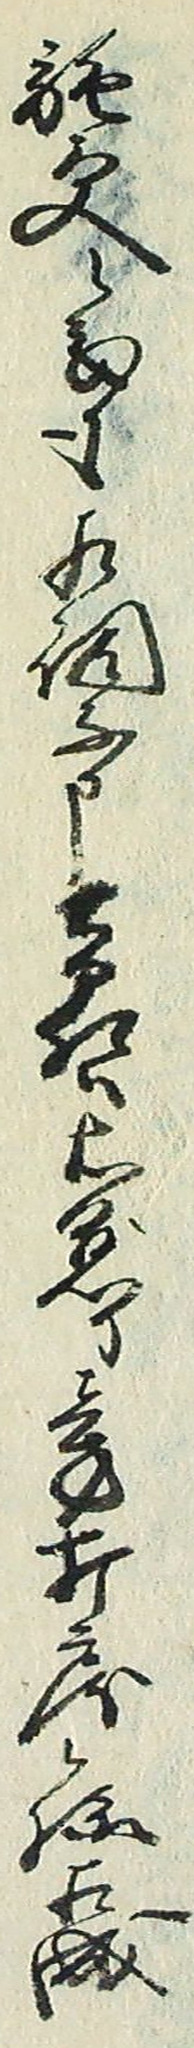施受之義も相調不申土州ハ右懸り旁打戻候様相成
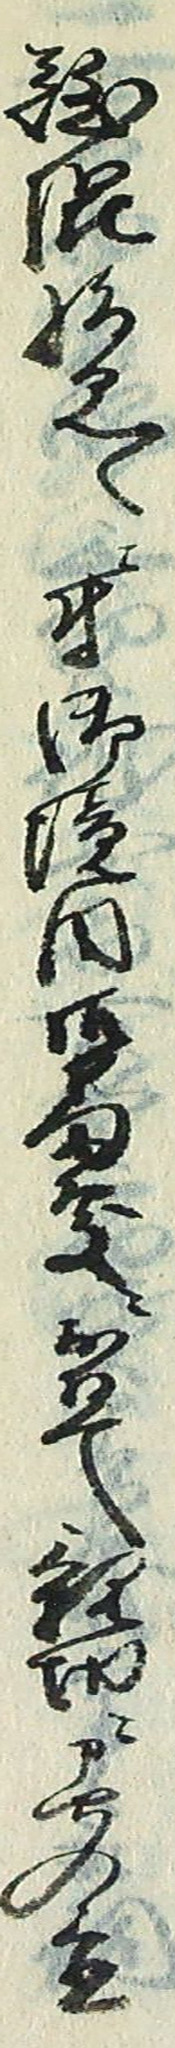難渋指見候ニ付御境目御番處ニおゐて親切ニ申聞置
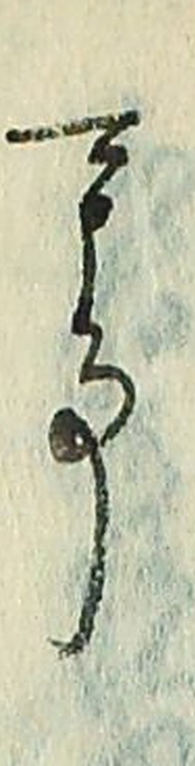可申事
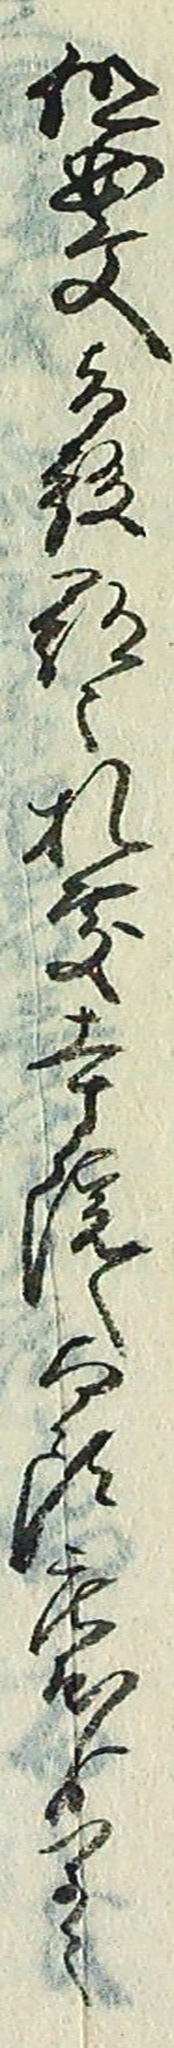但本文旨趣郡々札處寺院へ与頭庄屋ゟ早々
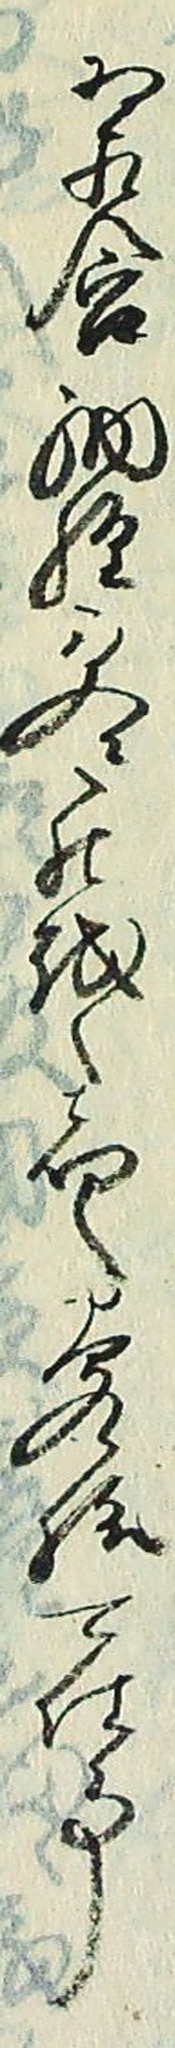為相含納経受ニ罷越候者へ申聞候様可仕事
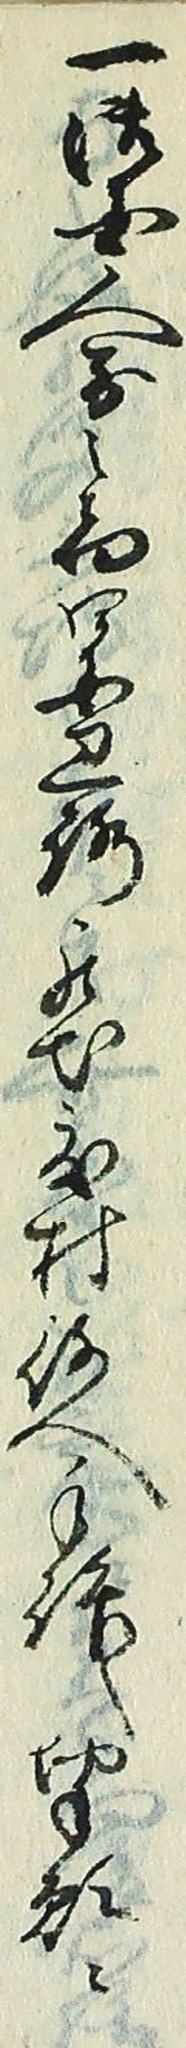一御国人別之者四国辺路罷出度村役人手許へ切手願ニ
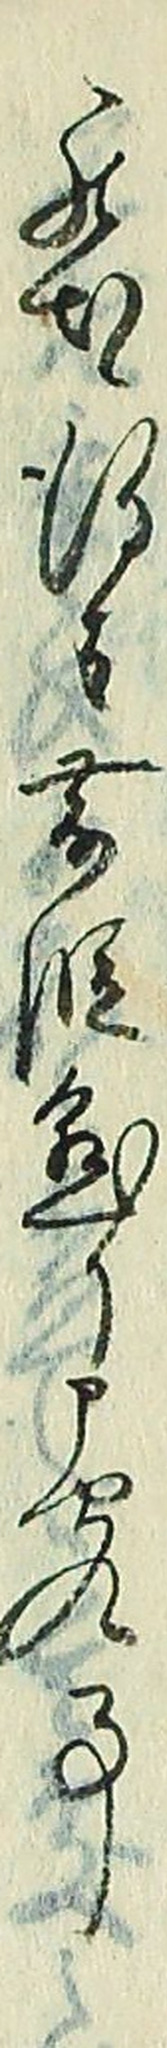罷出候得共前段懸り申聞候事
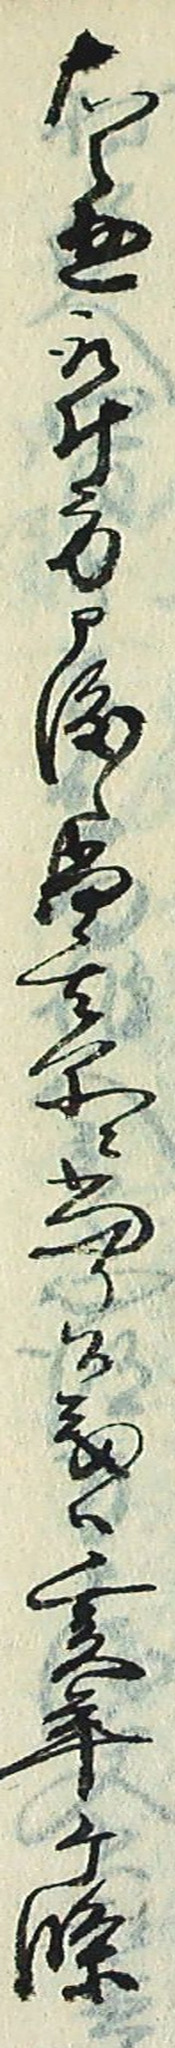右之通取計方申渡候尚其品ニ當り候義ハ亥年ケ條
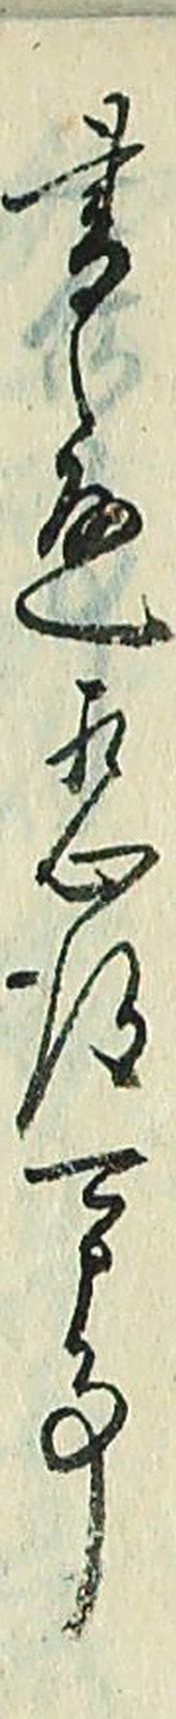書之通相心得可申事
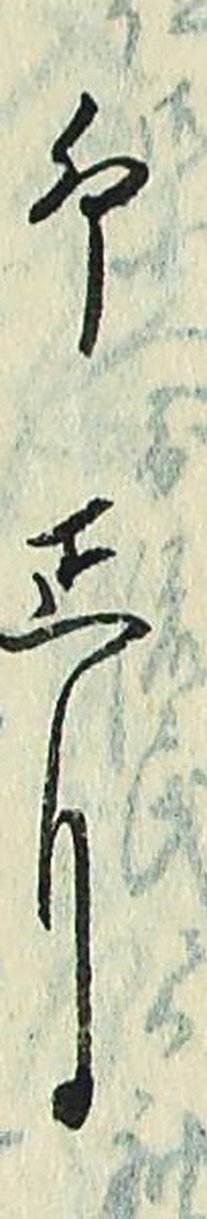卯正月
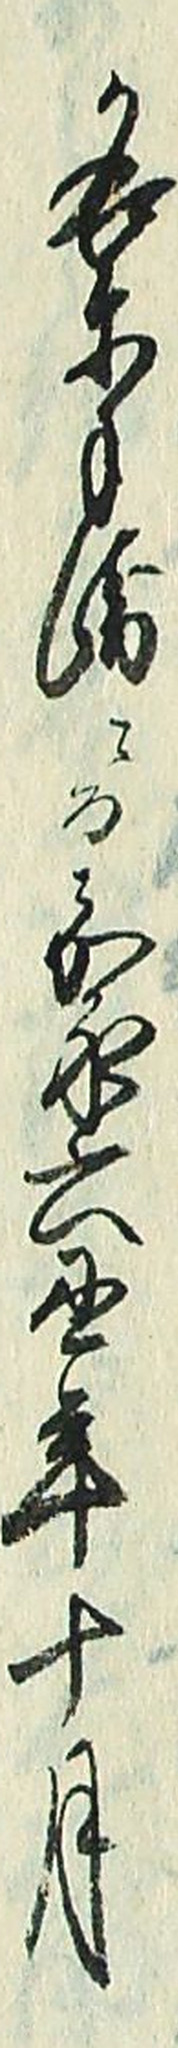名東手崎ニ而嘉永六丑年十月
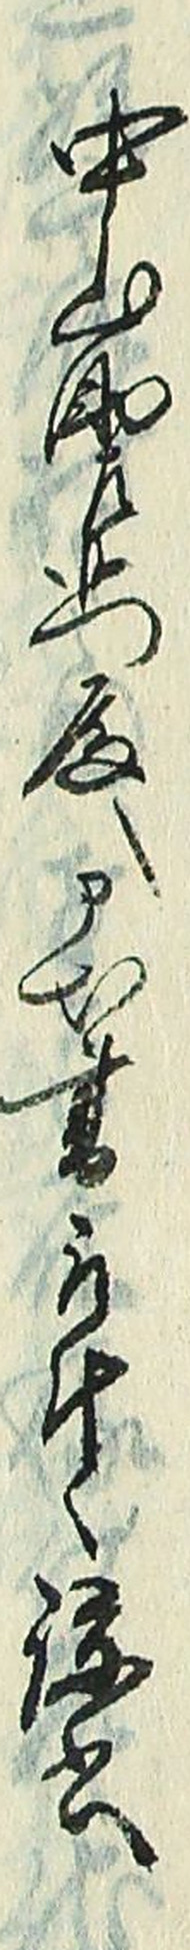中山助左衛門殿へ申出書取計候添書

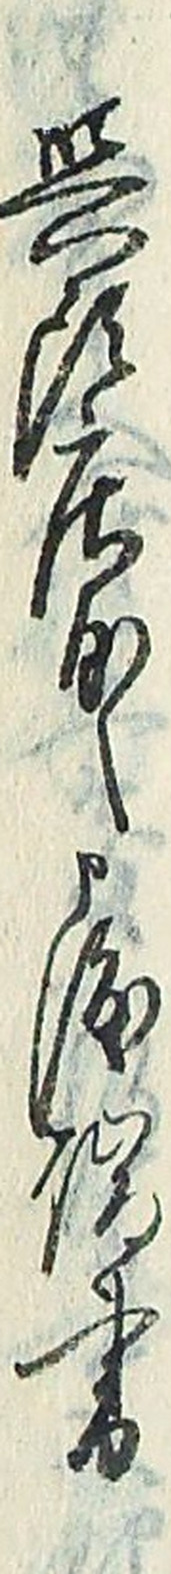與頭庄屋へ申渡端書
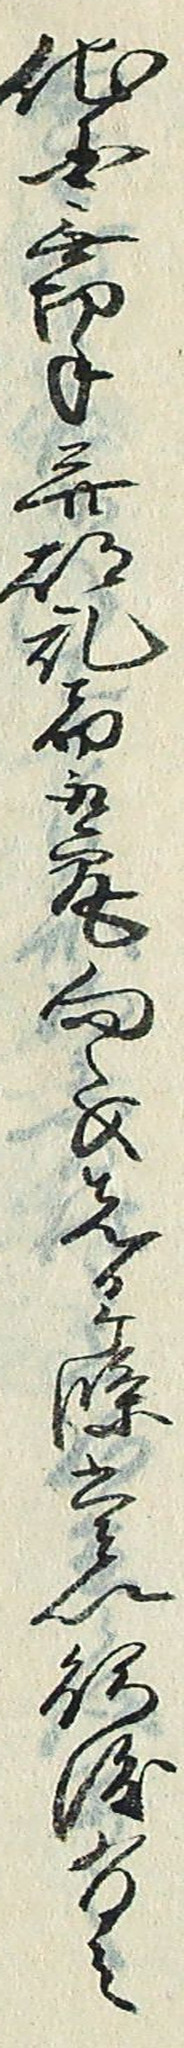他国無切手幷胡乱者取究向之義先日ケ條書を以觸渡有之
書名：諸御趣意書并御下知向之写
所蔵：鳴門教育大学 Naruto University of Education
